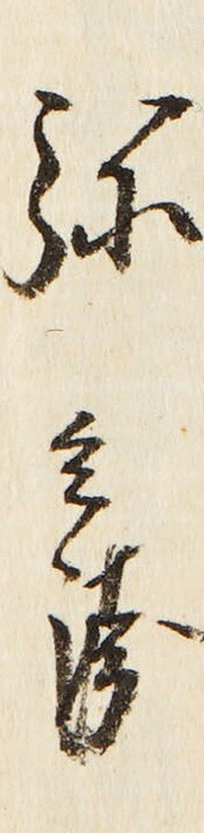弥兵衛
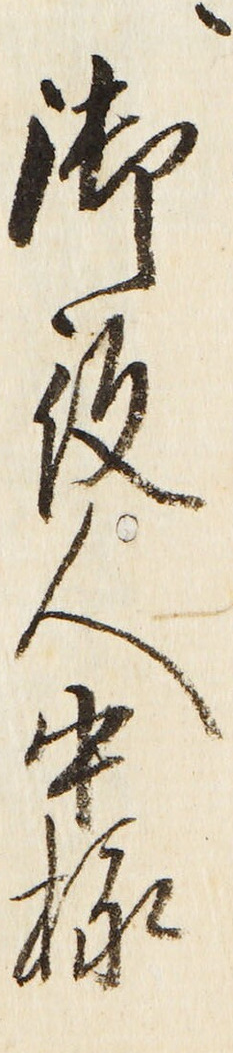御役人中様

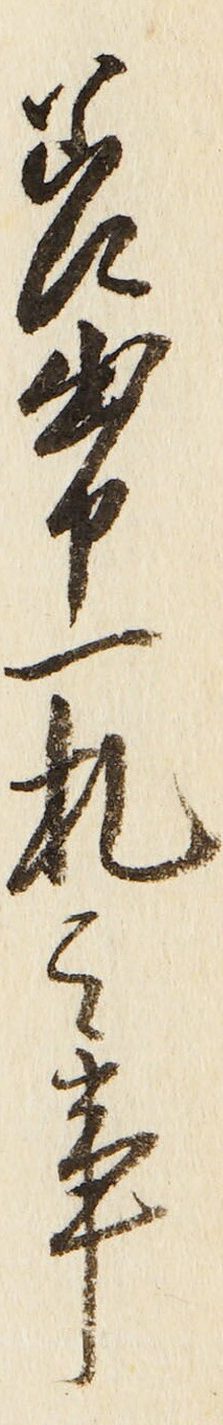差出申一札之事
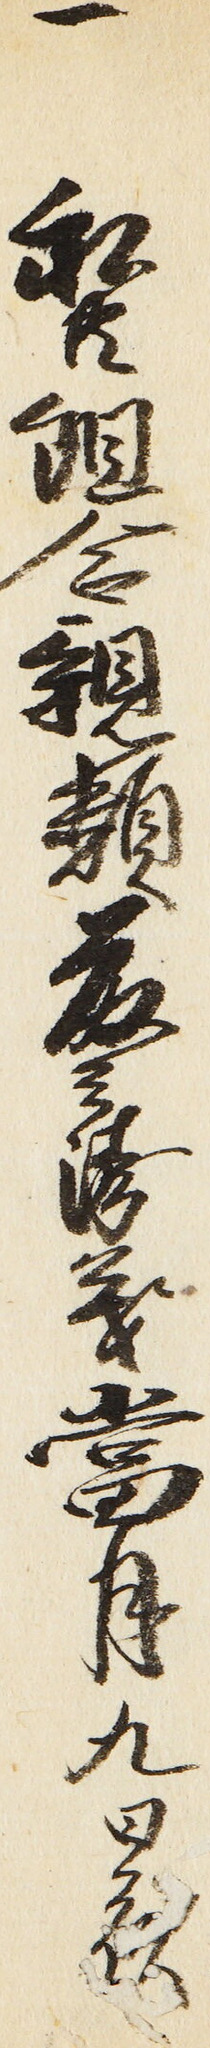一私共組合親類藤兵衛義当月九日夜
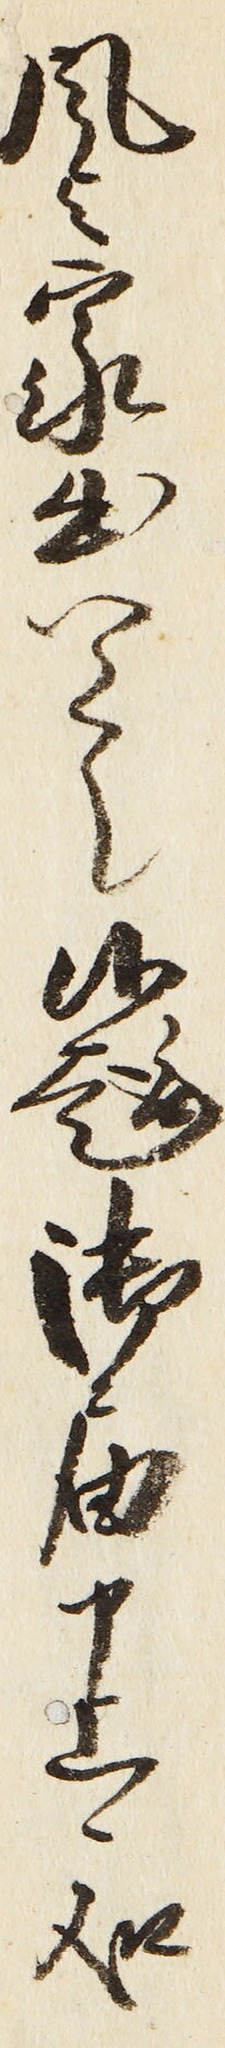風与家出いたし候趣御届申上候処
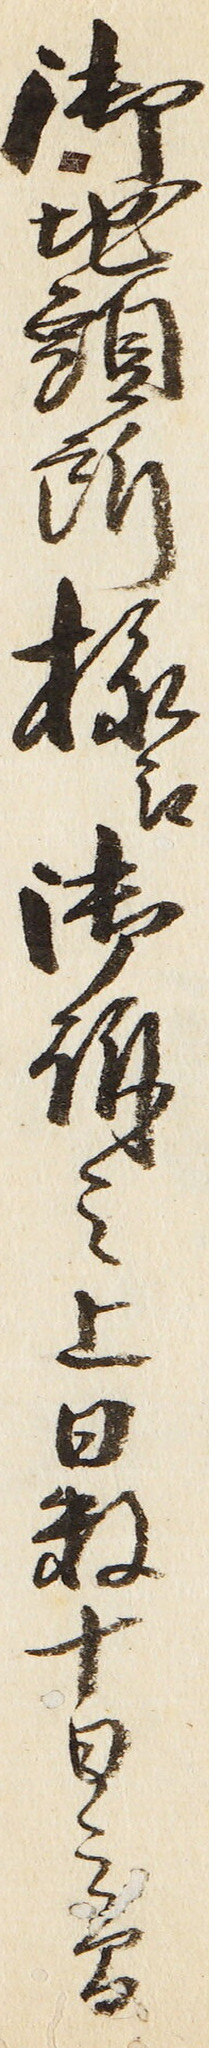御地頭所様江御訴之上日数十日之間
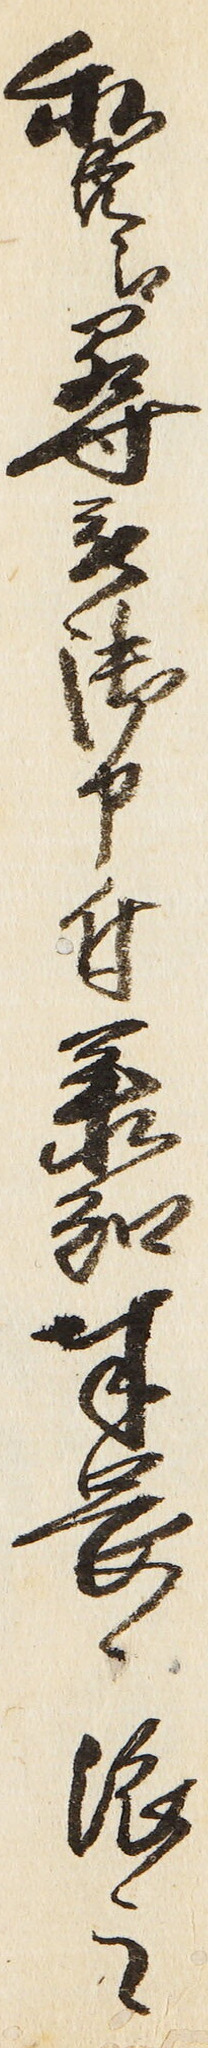私共江尋被御申付承知奉畏候依之
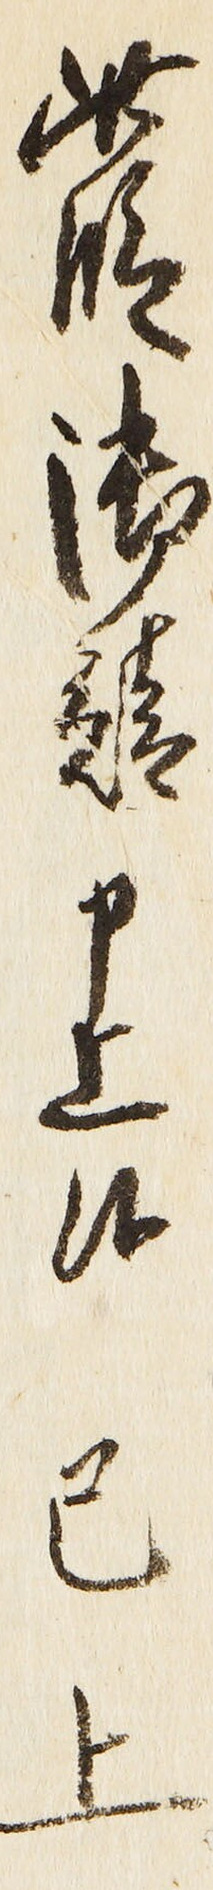此段御請申上候已上
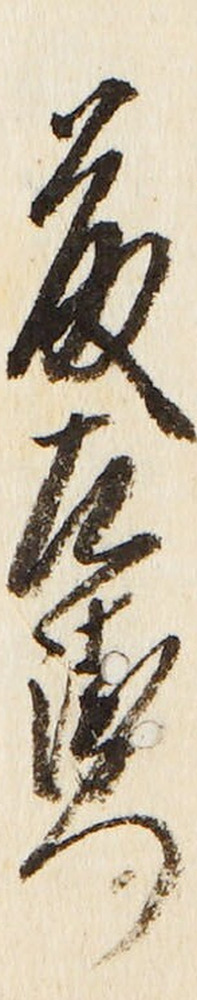藤左衛門
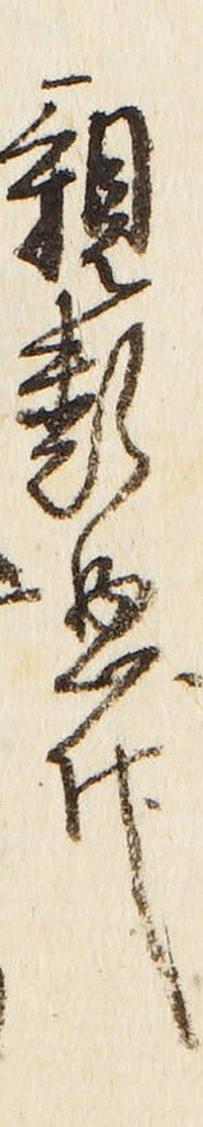親類惣代
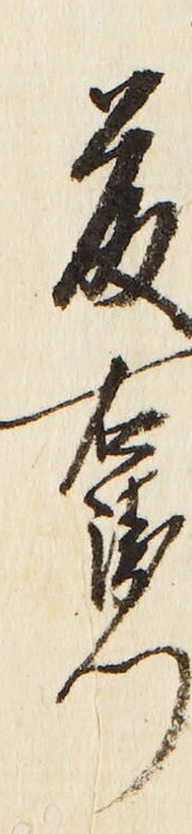藤右衛門
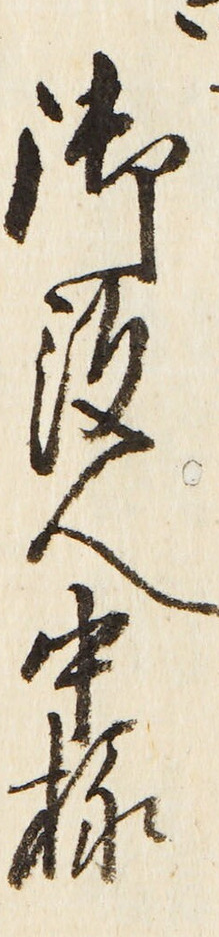御役人中様

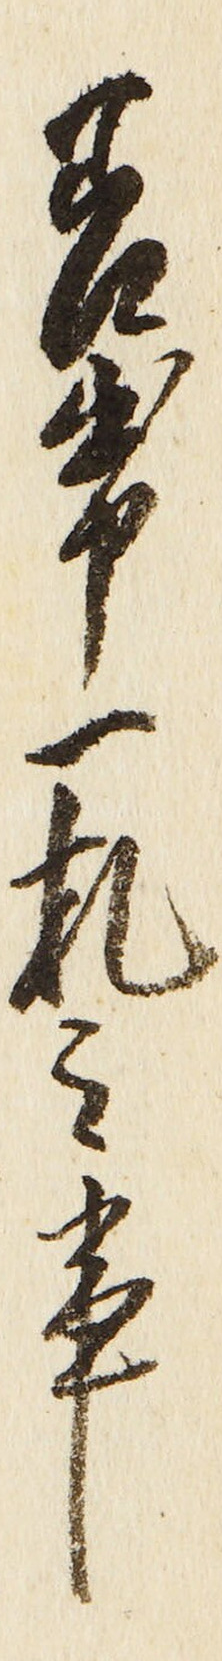差出申一札之事
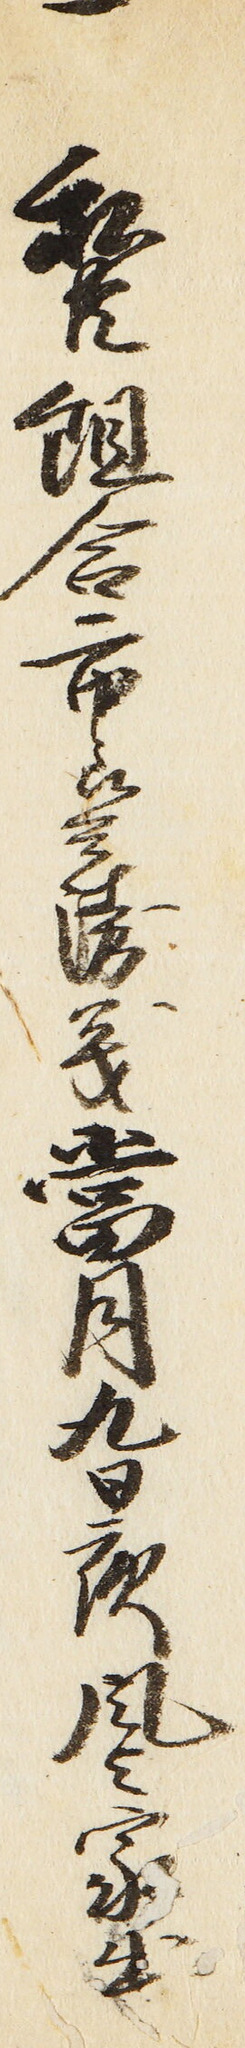一私共組合市郎兵衛義当月九日夜風与家出
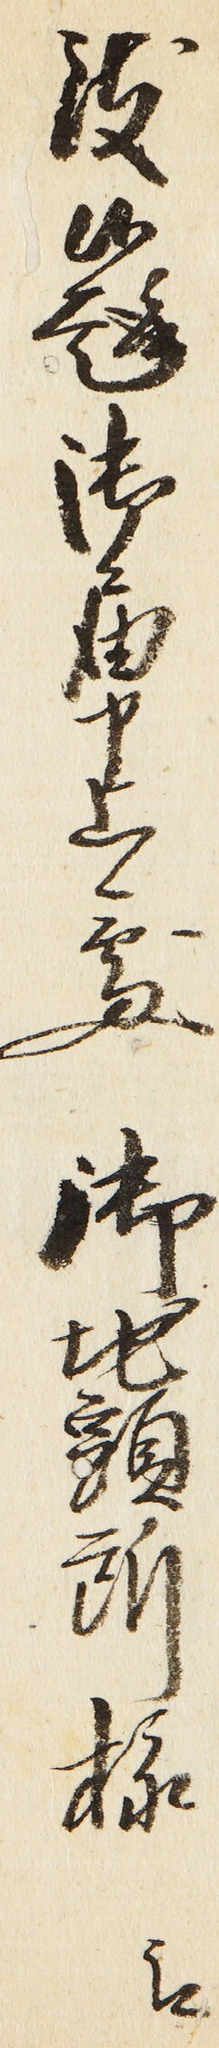致候趣御届申上候処御地頭所様江
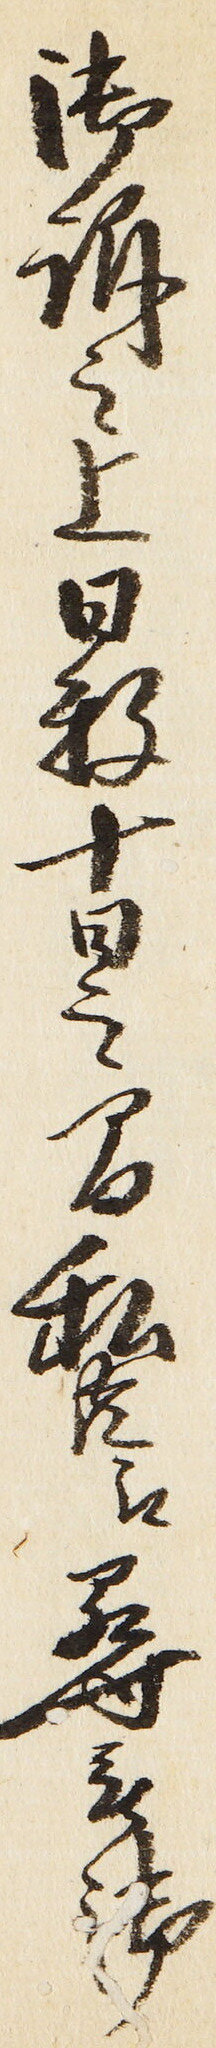御訴之上日数十日之間私共江尋被御
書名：難船一件記録
